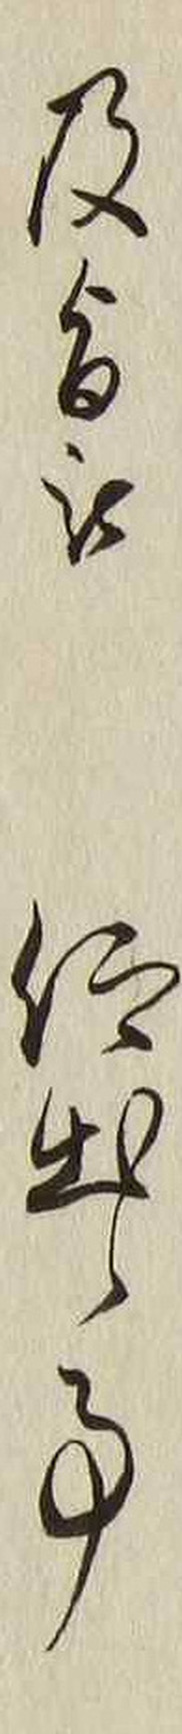及旨被仰出候事
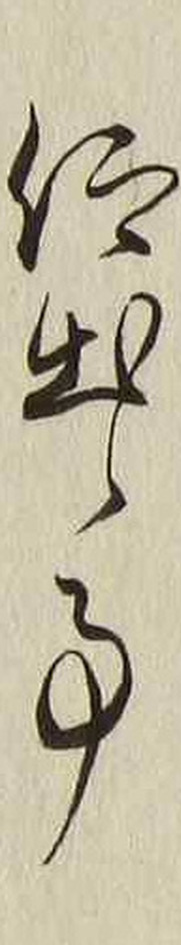仰付候事
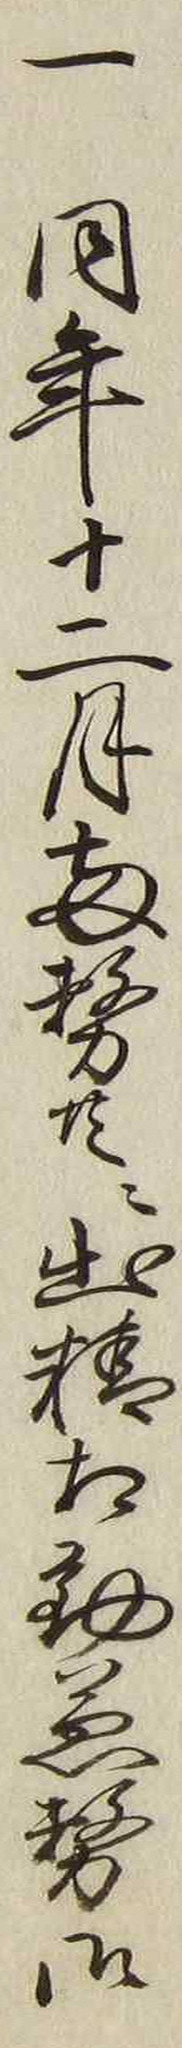一同年十二月両務共ニ出精相勦兼務御
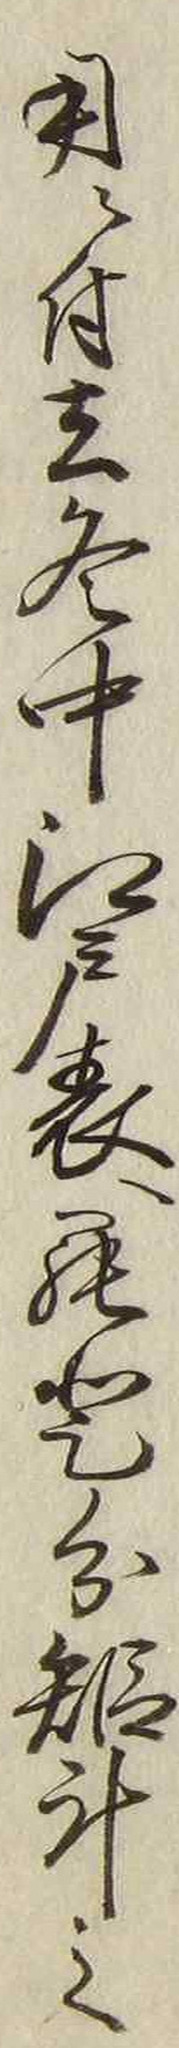用ニ付去冬中江戸表へ罷登分矩斗之

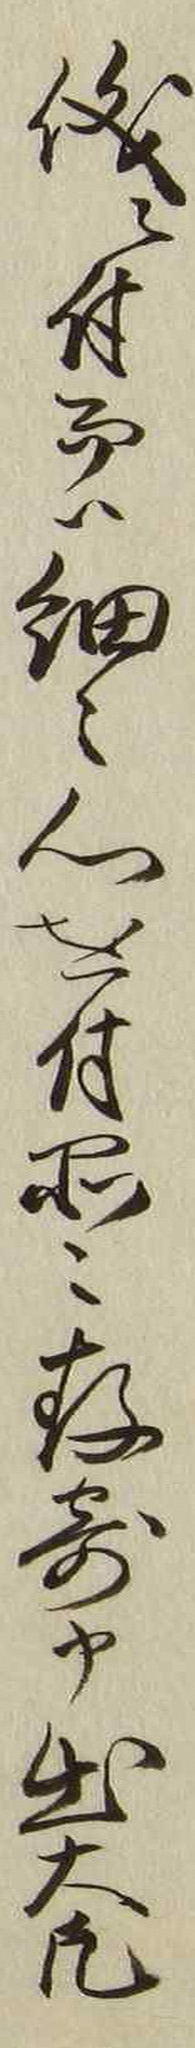儀ニ付而ハ細々心を付品々存寄申出大凡
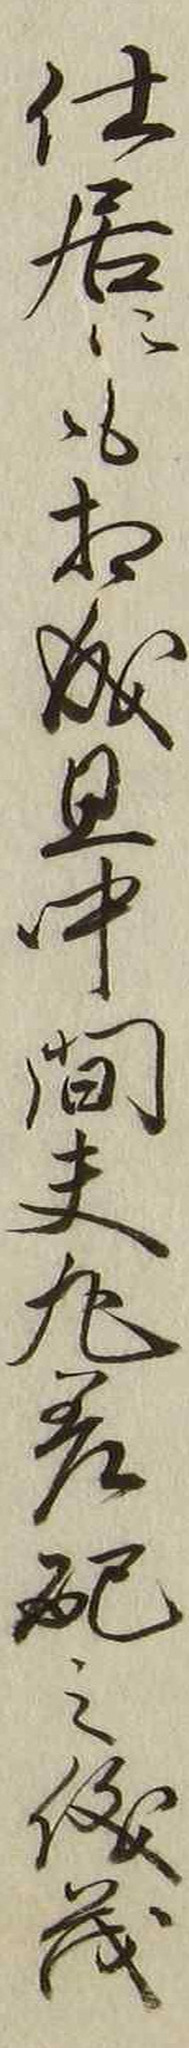仕居にも相成旦中間夫丸差配之儀茂
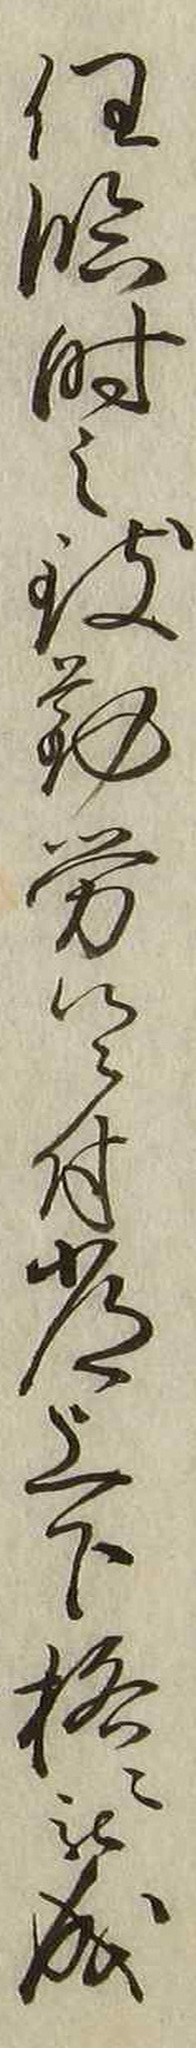任臨時之致勤労候ニ付常上下格ニ被成
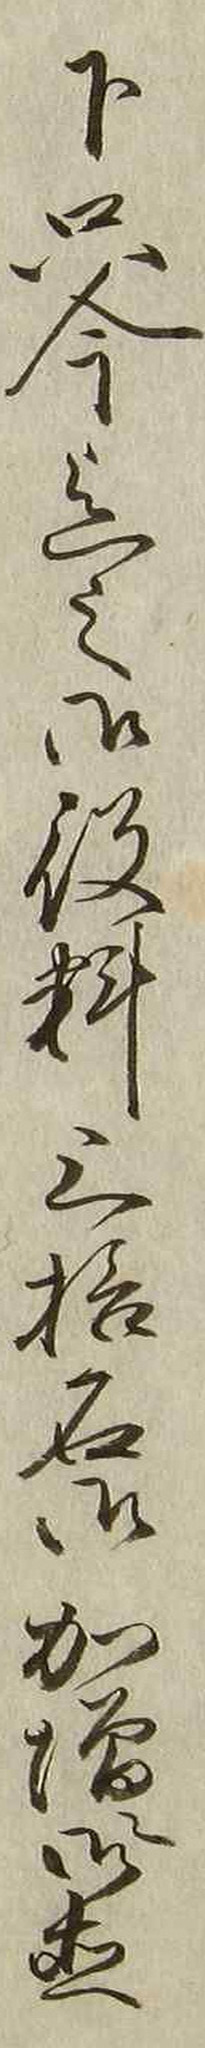下只今迄之御役料三拾石御加増ニ御直
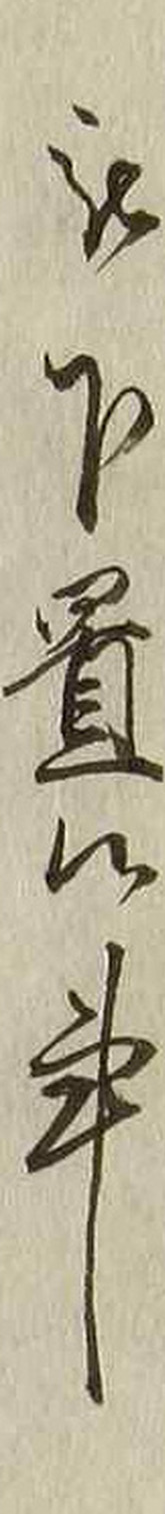被下置候事
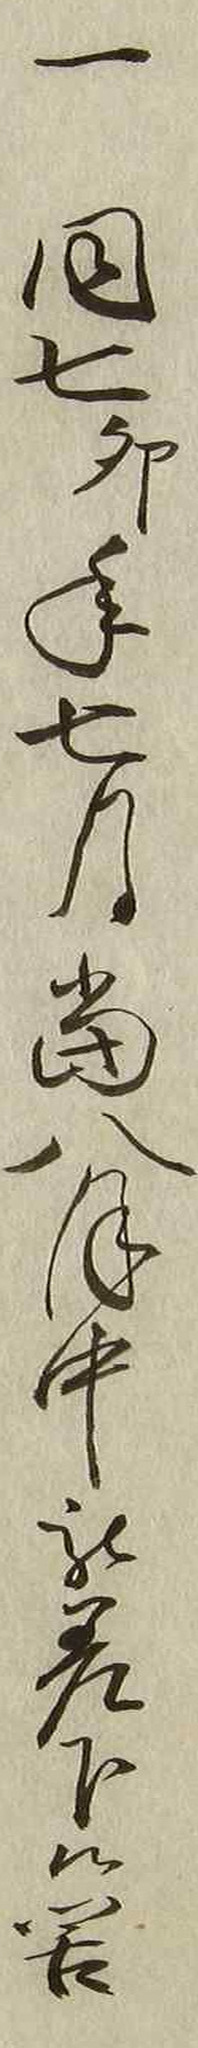一同七卯年七月当八月中被差下侯筈
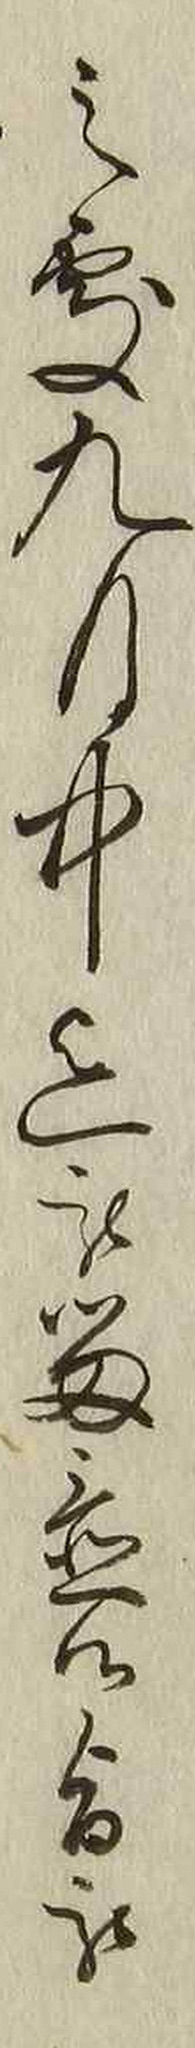之処九月中迄被留置候旨被
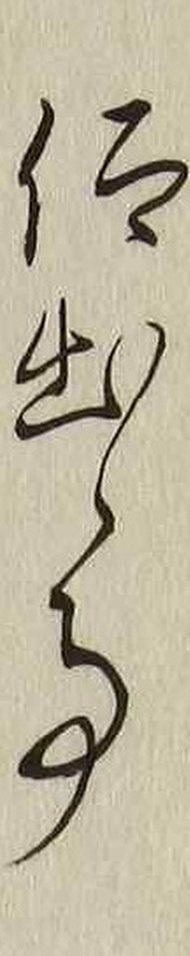仰出候事
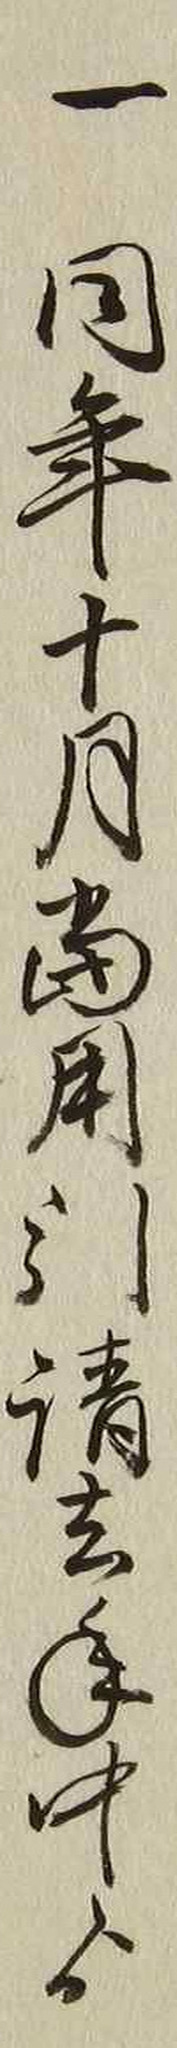一同年十月当用引請去年中ゟ
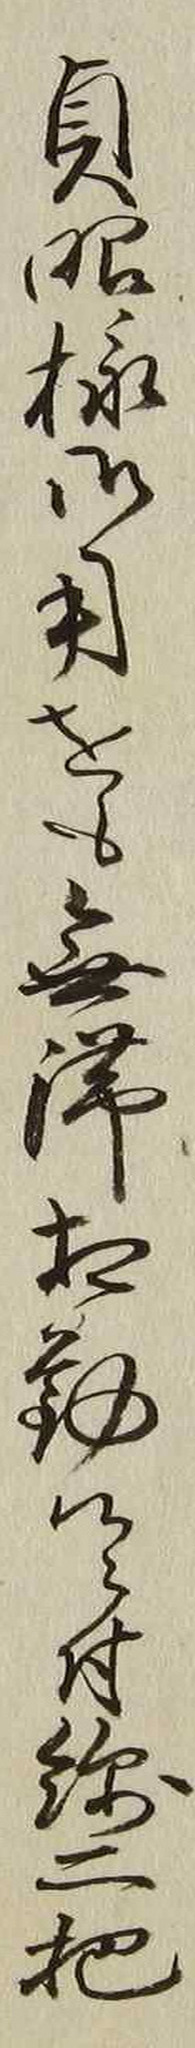貞昭様御用をも無滞相勤候ニ付綿二杷
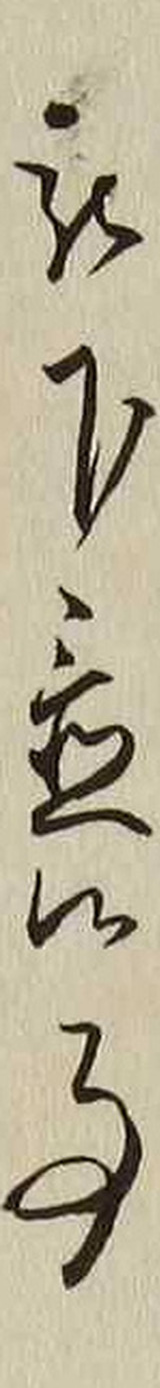被下置候事
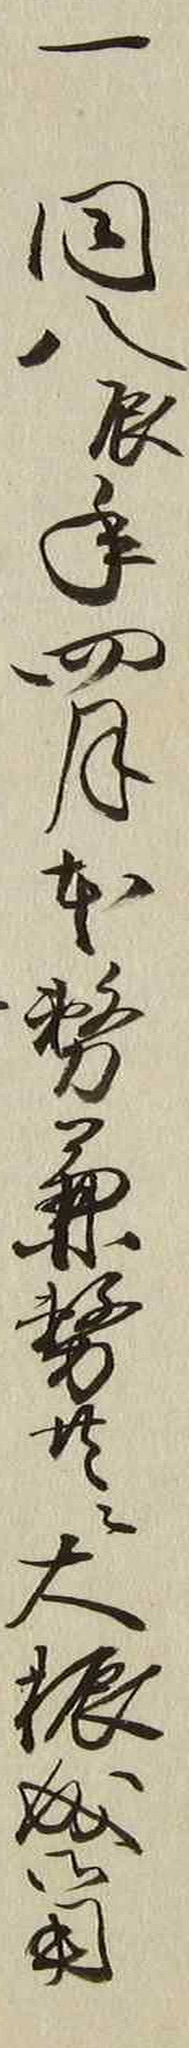一同八辰年四月本務兼務共ニ大振成御用
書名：諸士系譜　巻之21　い之部21
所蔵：会津若松市立会津図書館
